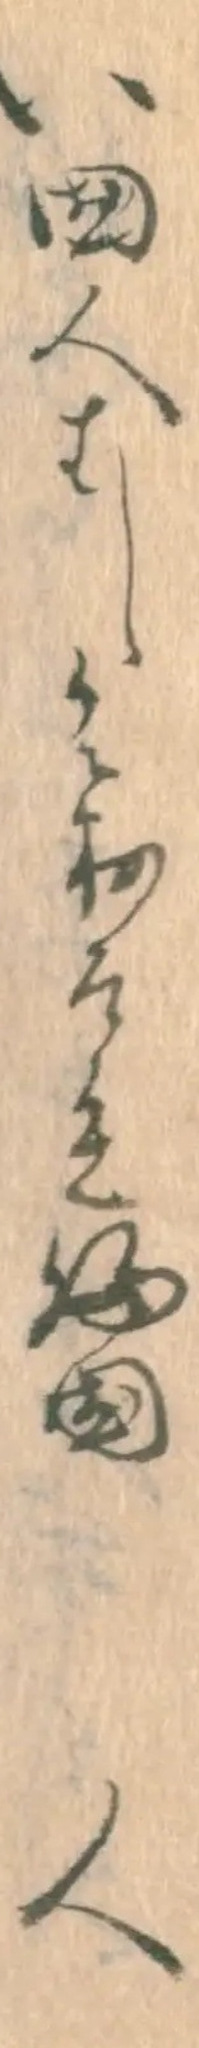い国人はしかにおそれ帰国人
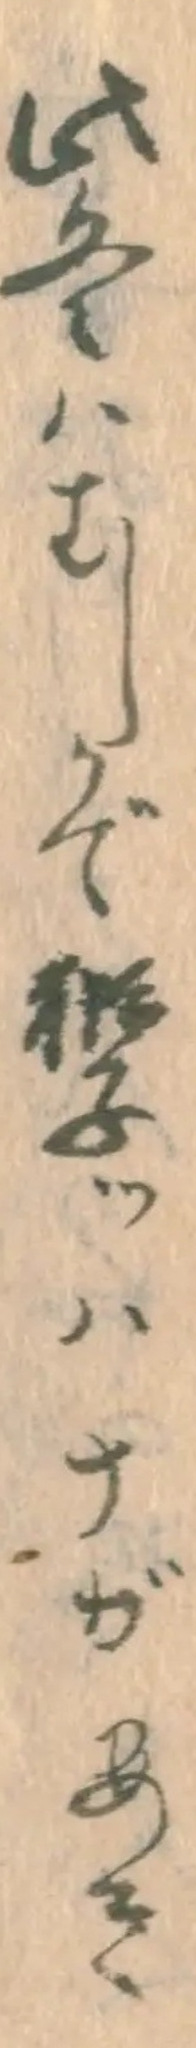此冬ははしかで獅子ッハナがあき
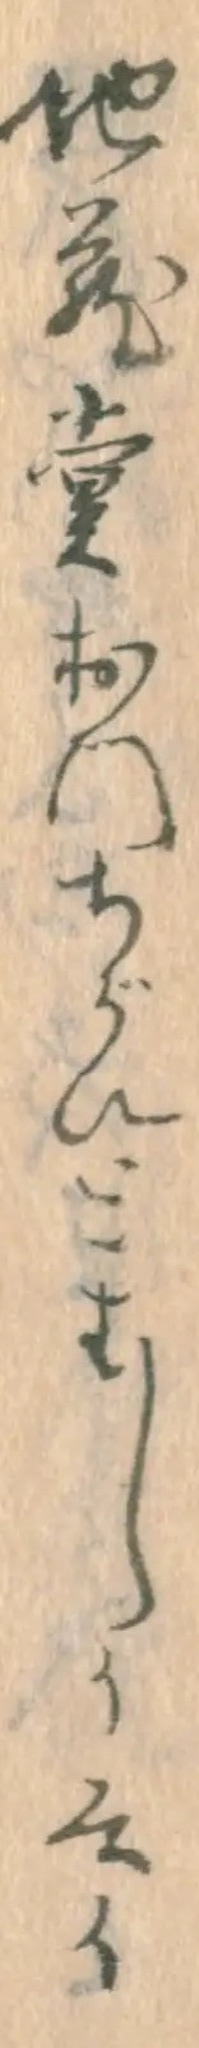地蔵堂お門ちがひとはしか云い
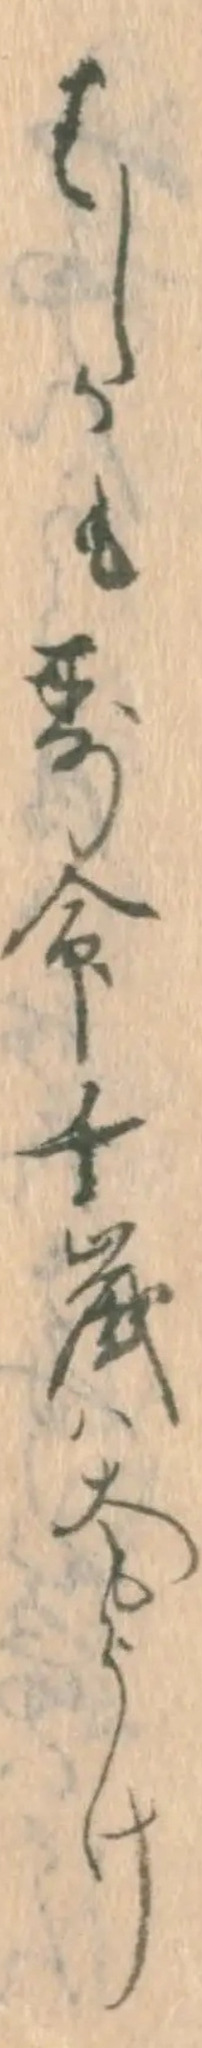はしかも寿命千歳は大もうけ
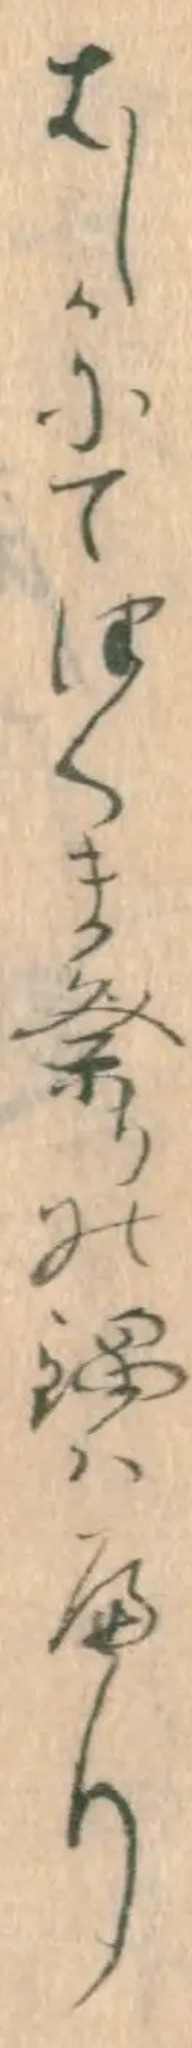はしかにてつくま祭りの鍋はへり
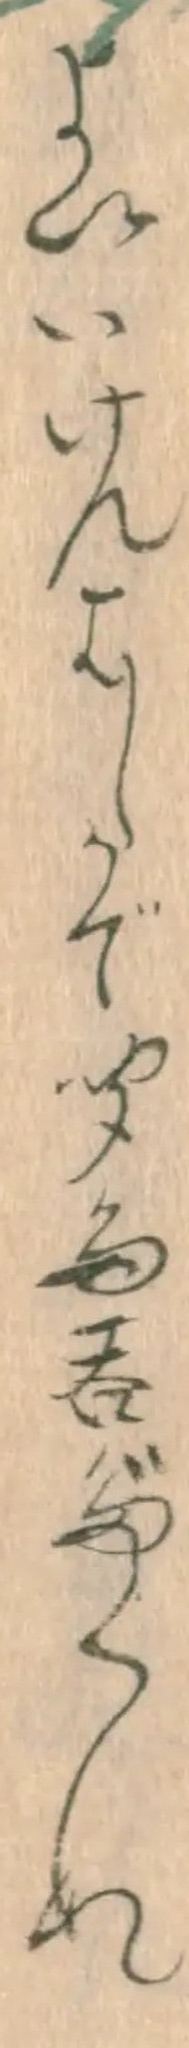よいいけんはしかで聞た呑だくれ
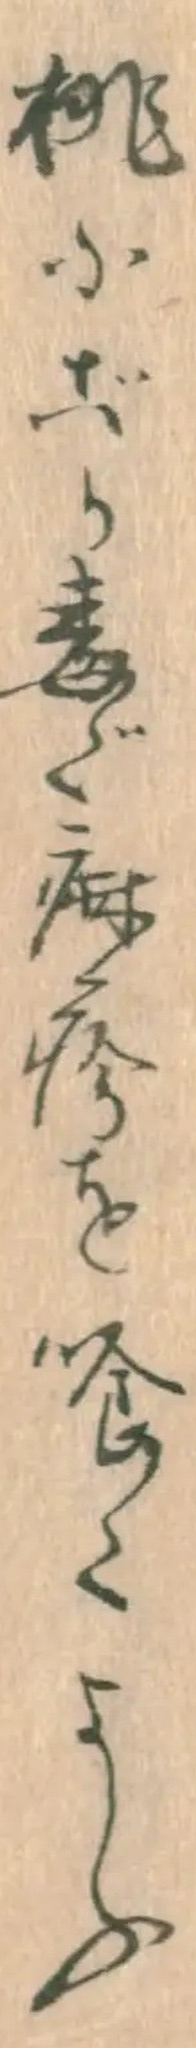桃にごり毒で麻疹を喰てよふ
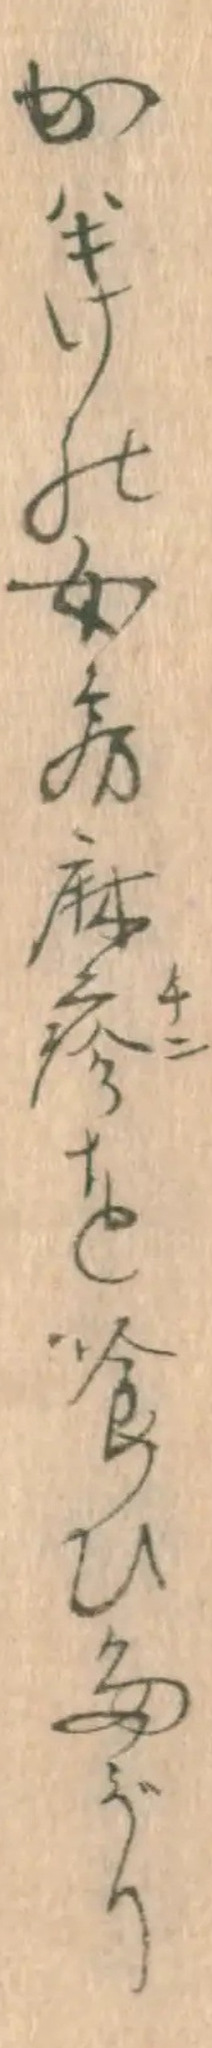加半けの女房麻疹を喰いたがり
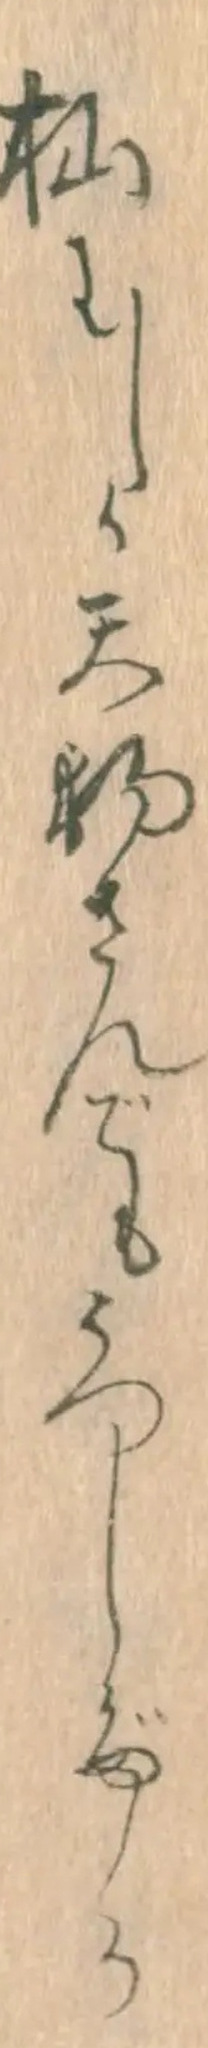杣はしか天狗さんにもうつしたか
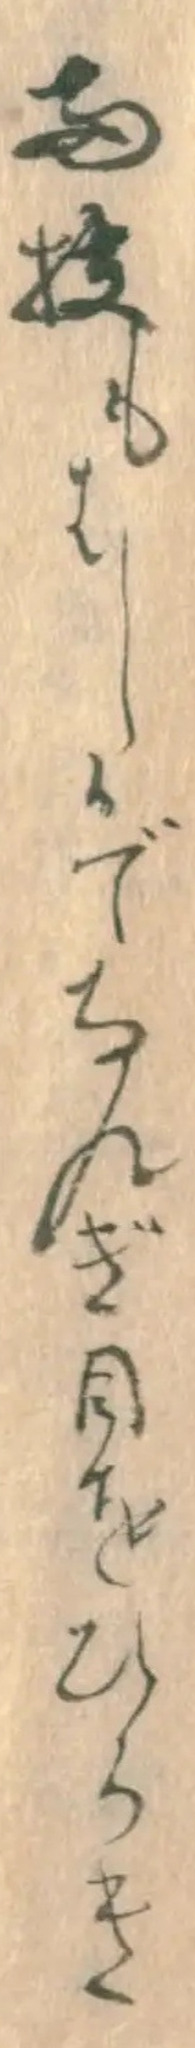両？もはしかでなんぎ目をひらき
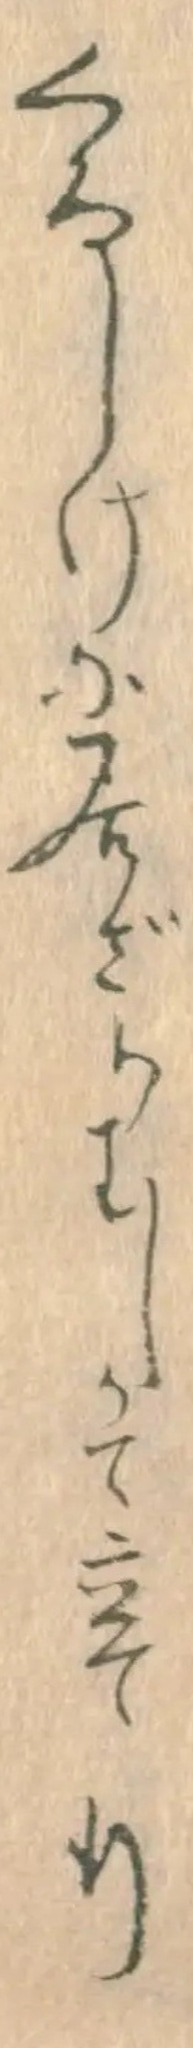くるしげに居ざりはしかで立て行
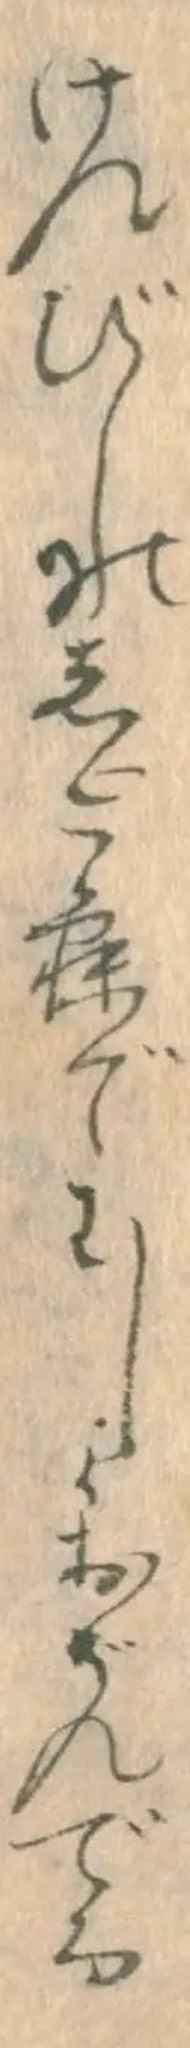けんびしのしと寝ではしかおがんでる
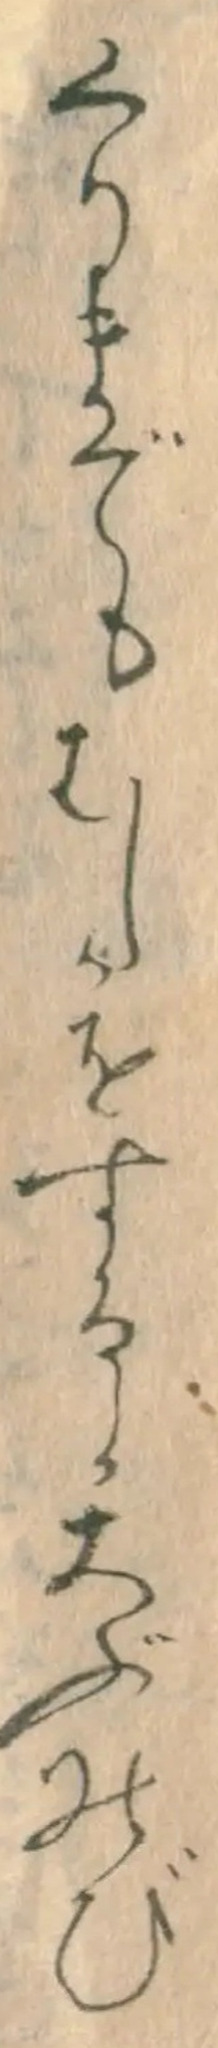くりまでもはしかをするか大ぶのび

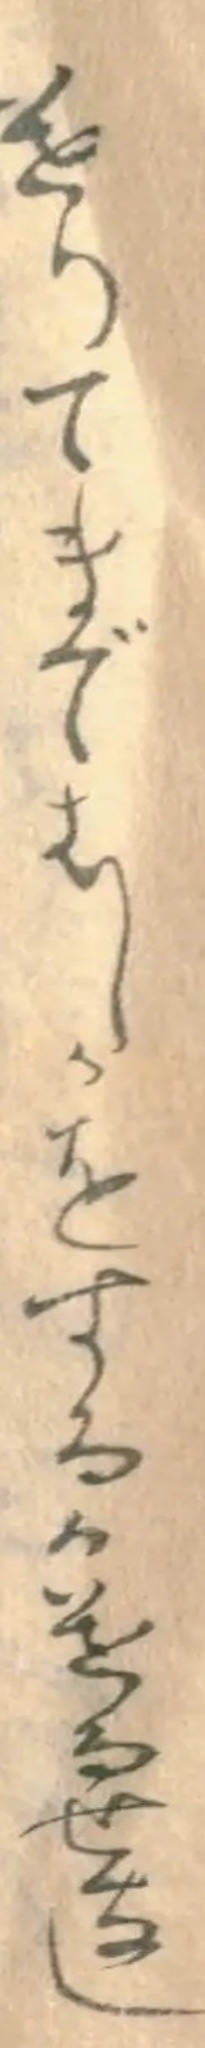遣りてまではしかをするか遣るせなし
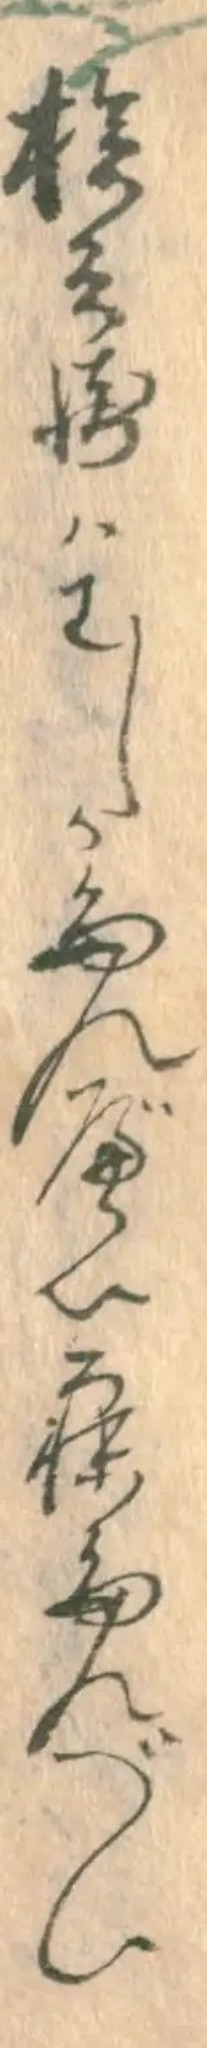権兵衛ははしかたんべい寝たんべい
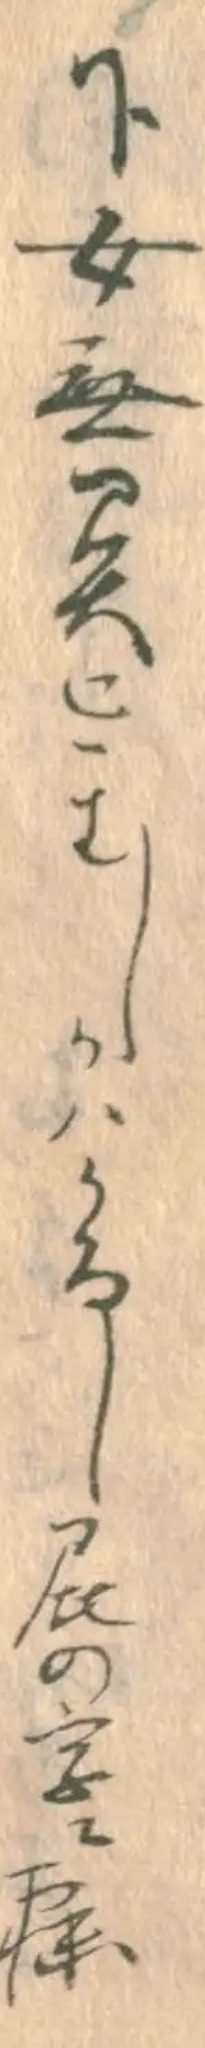下女無異とはしかはかるし屁の字に寝
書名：麻疹後柳樽
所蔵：国立国会図書館 National Diet Library, JAPAN
